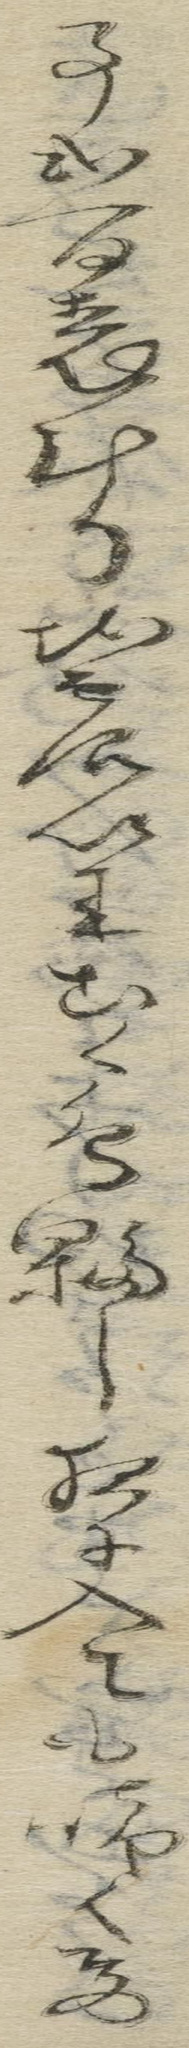事弐百表計り地震以来むく鳥夥し夜に入とも啼くその
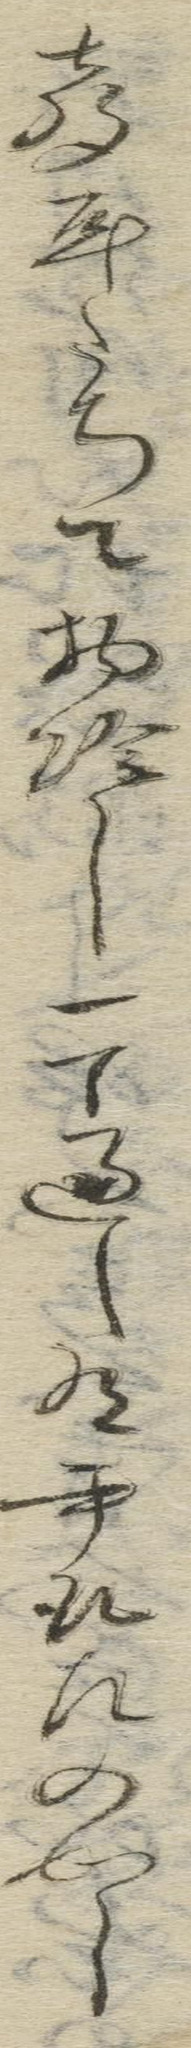声牙たちて物冷し一丁通し有事記左の如し
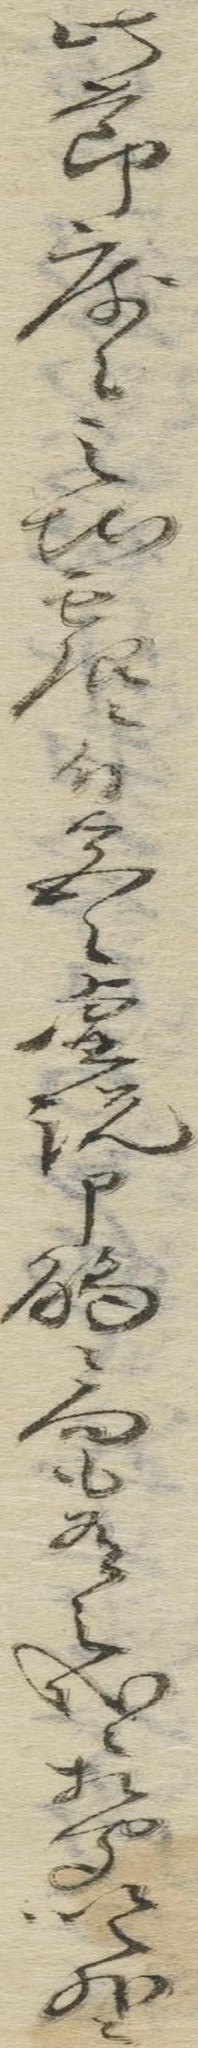此節度々之地震二付色々虚説申触候向も有之哉二相聞以之外二
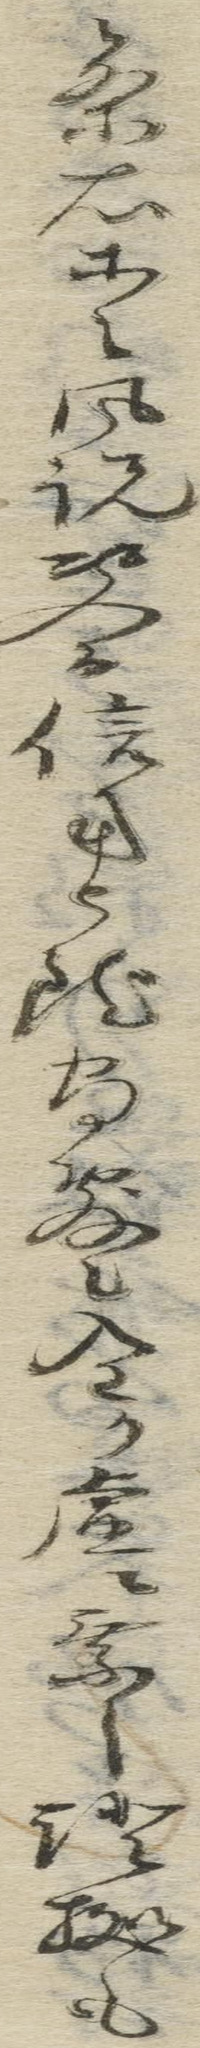候条右等之風説決而信用と致間敷候全ク虚二乗し訟拠も
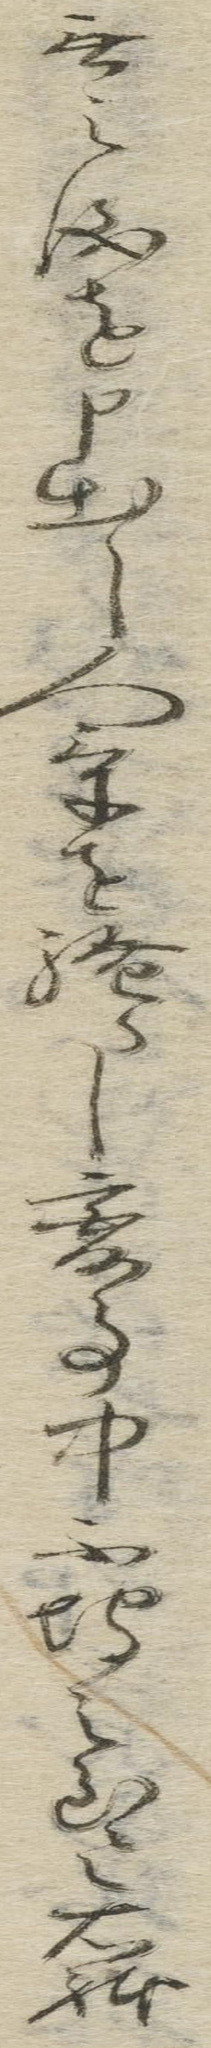無之儀を申出し人気を騒かし変事中不埒之至候右躰
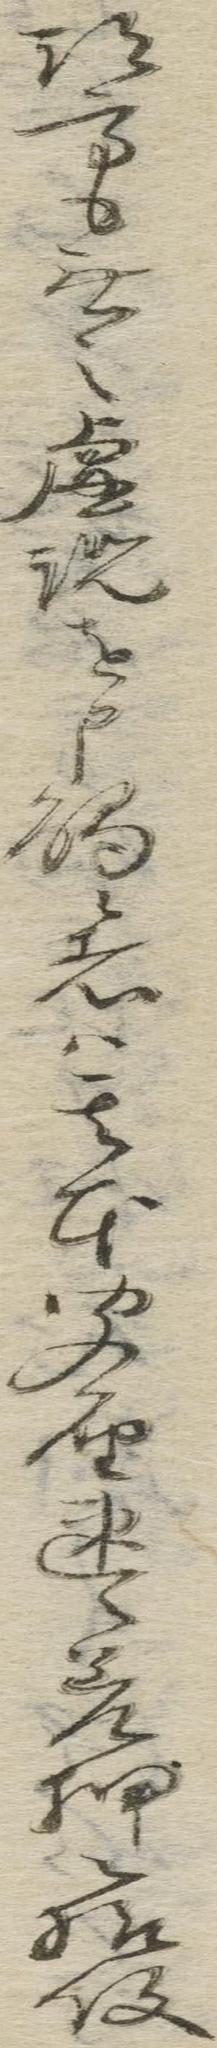跡形も無之虚説を申触候者ハ其本聞届速々差押候様役
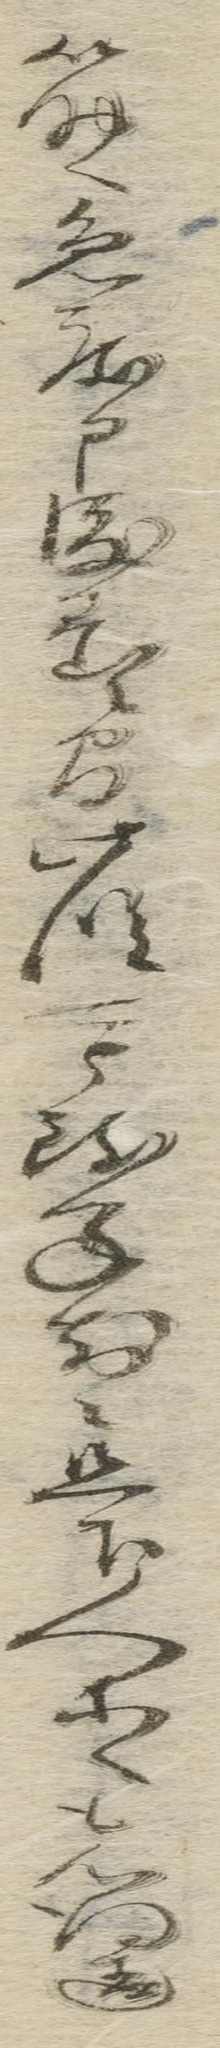筋へ急度申渡置候間此段可被越事前二且下人等へも心得違
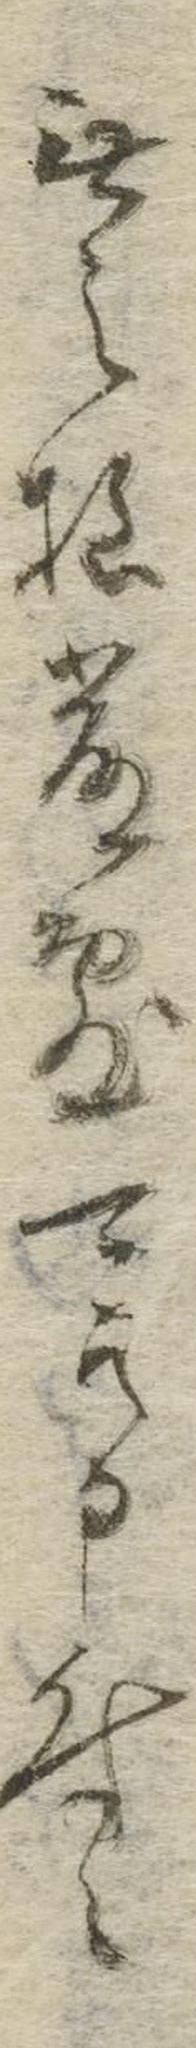無之様厳敷可被申付候
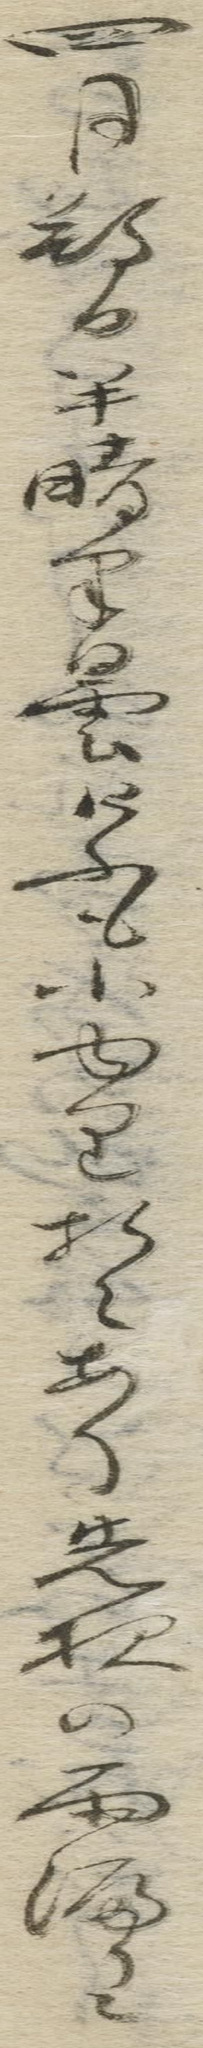四月朔日半晴半曇けふも小ゆり折々あり先夜の雨漏り二
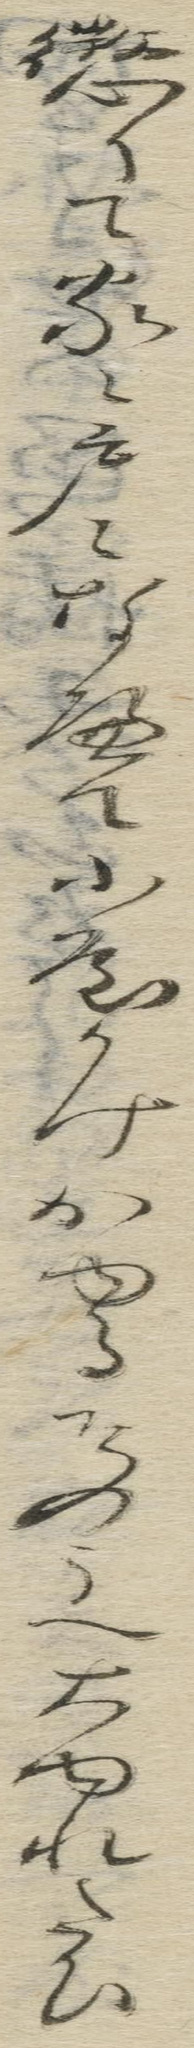懲りて家々戸々なへて小屋かけかゆるそのうへ大ゆれたひ
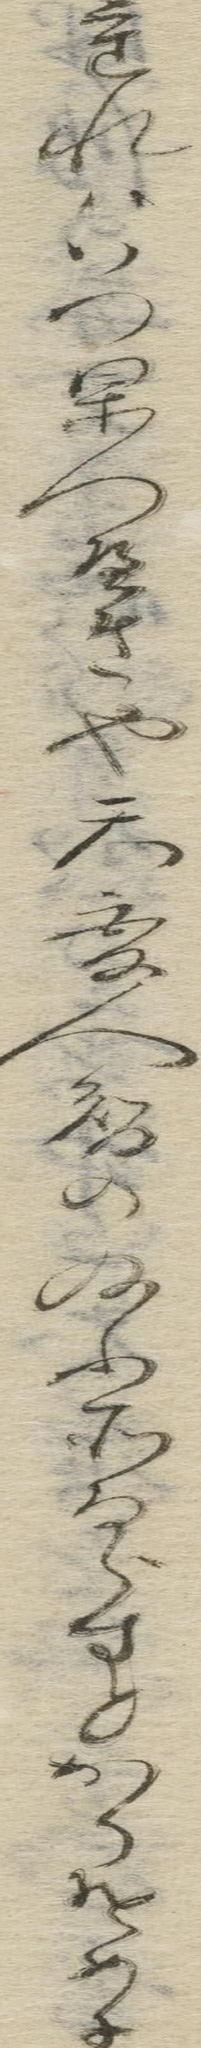重れハいつ果つへきや天変人智の給ふ所ならすもかりそめに
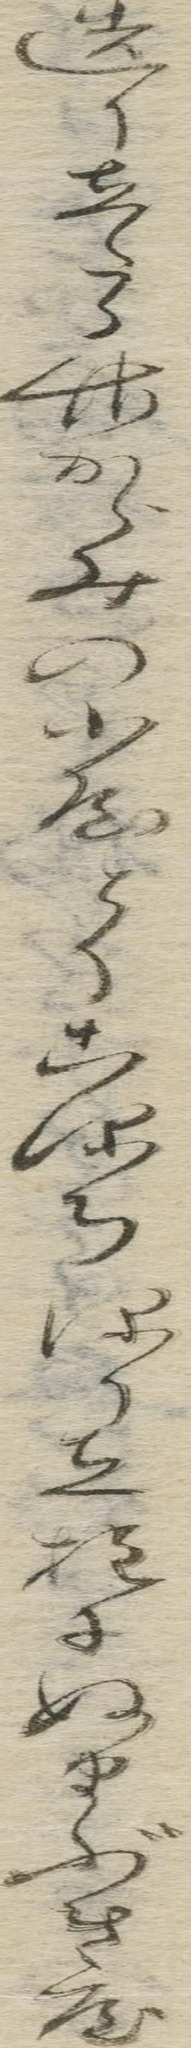造り立たる竹からみ小屋はりこほちほり立柱にぬまぶき屋
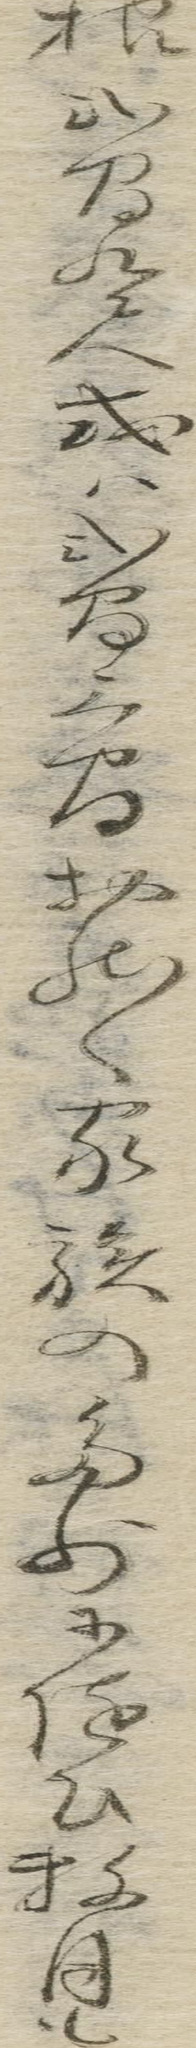根弐間九尺或ハ弐間三間おの〳〵家族の多少に随ひ数月も
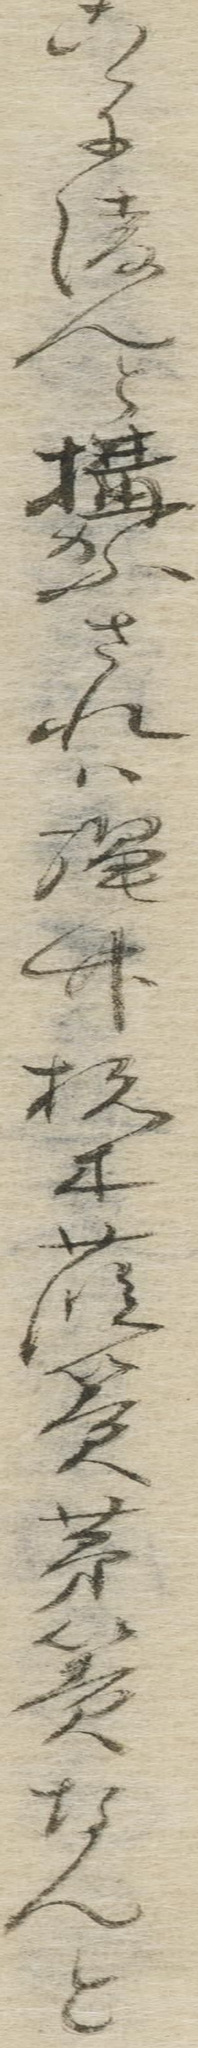こゝに凌んと構ふされハ縄竹杉木葭簀茅簀なんと
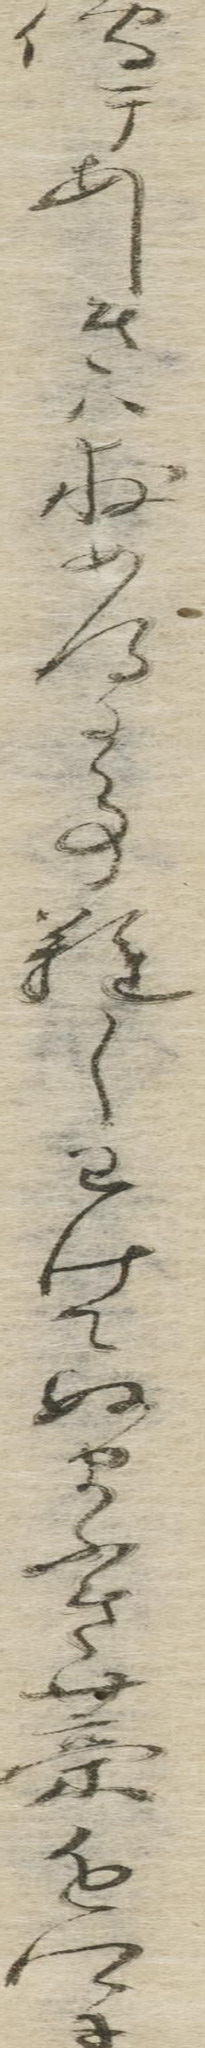伝テあしきハ求めえる事難しわけてぬまふき藁近郷に
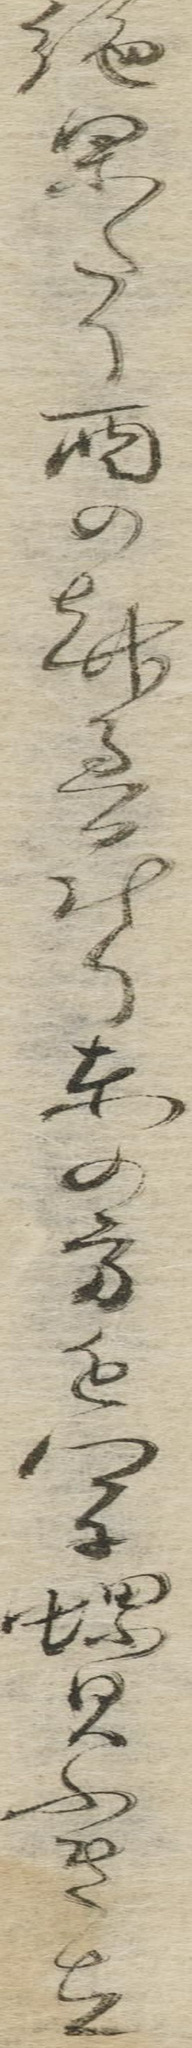絶果たり酉の刻過二けり東の方近郷に螺貝ふき在
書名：弘化丁未天變日記
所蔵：東京大学地震研究所図書室 Earthquake Research Institute Library, The University of Tokyo, JAPAN
